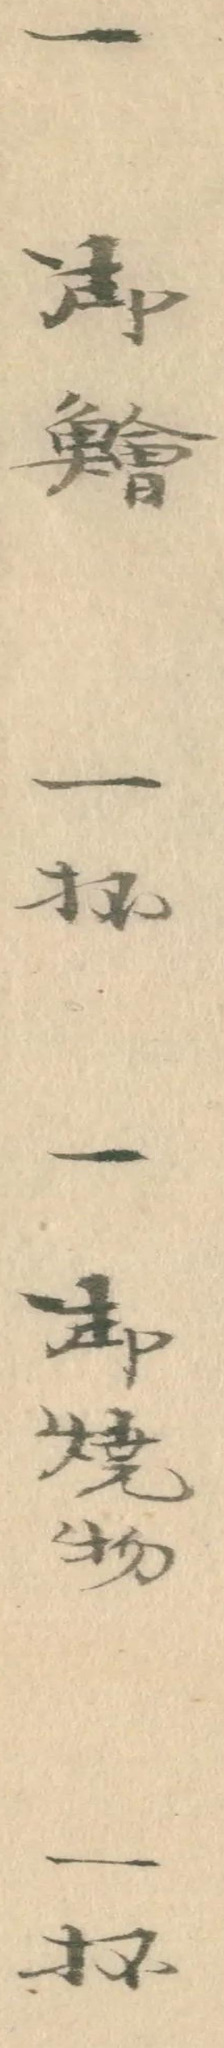一御鱠一抔一御焼物一抔

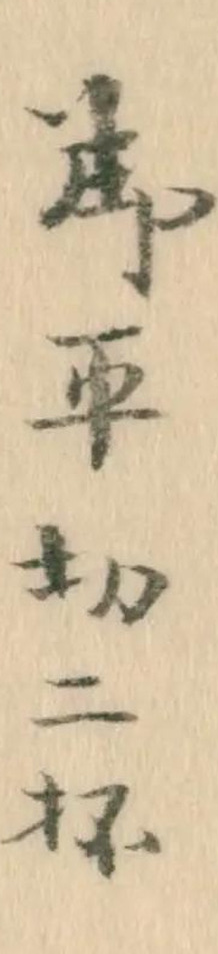御細切二抔
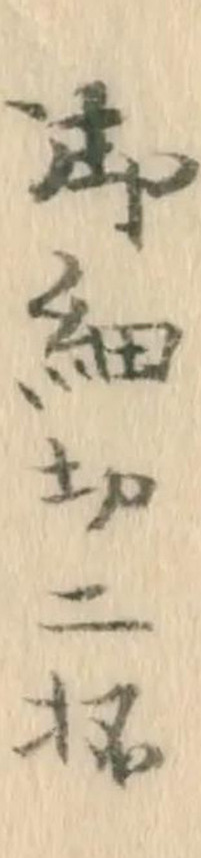御細切二抔
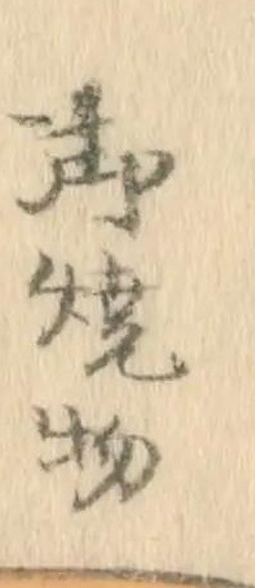御焼物

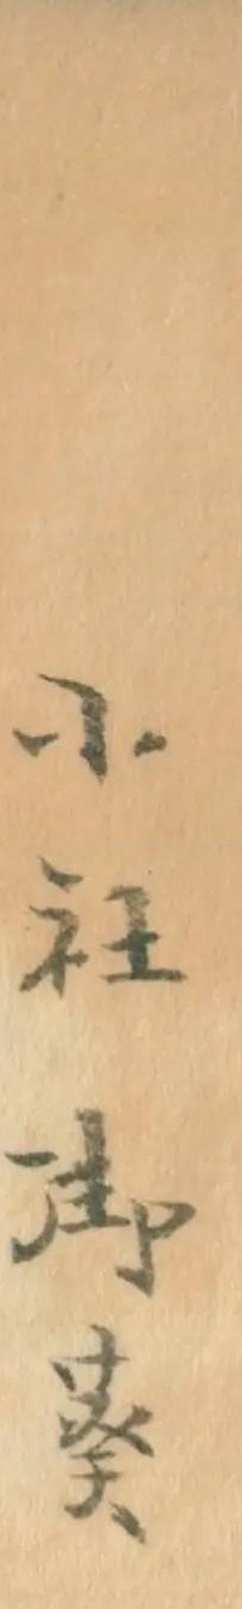小社御葵
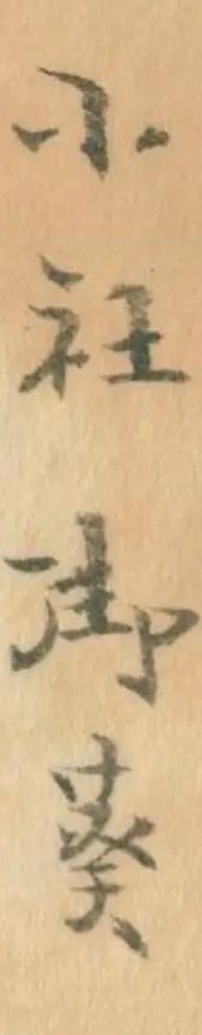小社御葵
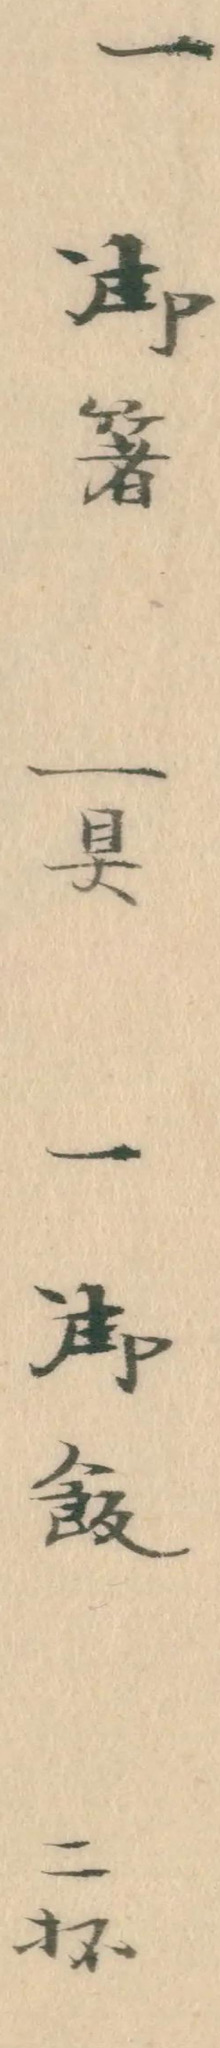一御箸一具一御飯二抔
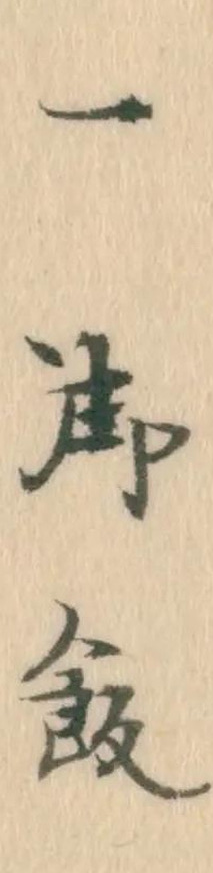一御酒一抔
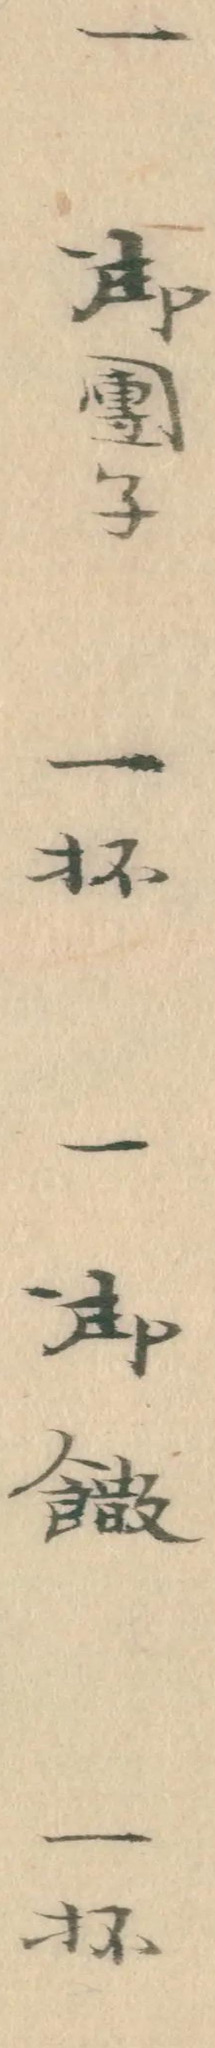一御団子一抔一御饊一抔
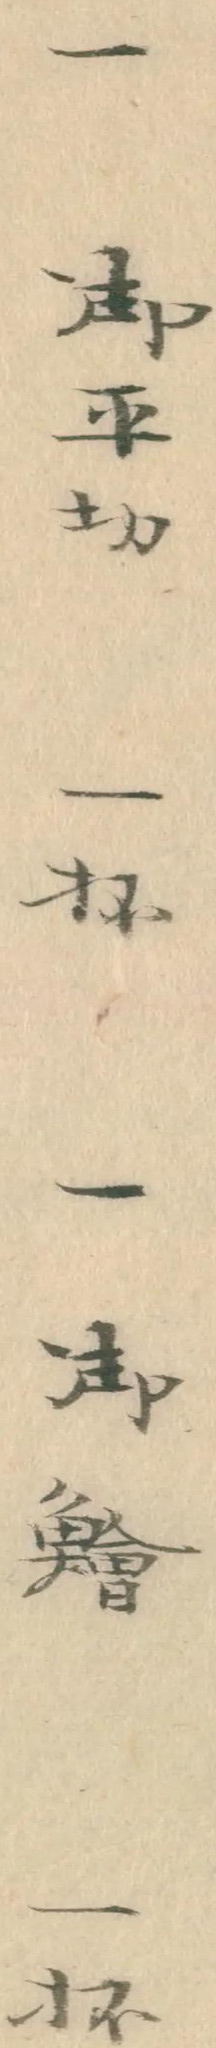一御平切一抔一御鱠一抔

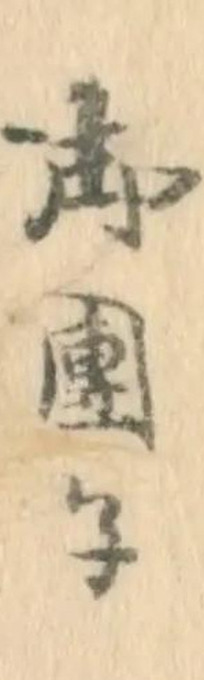御団子
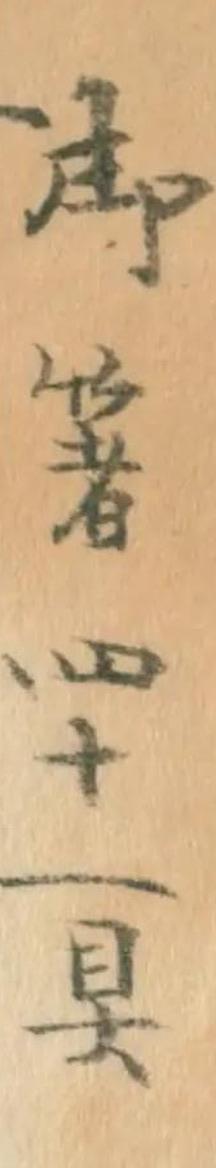御饊四十一杯
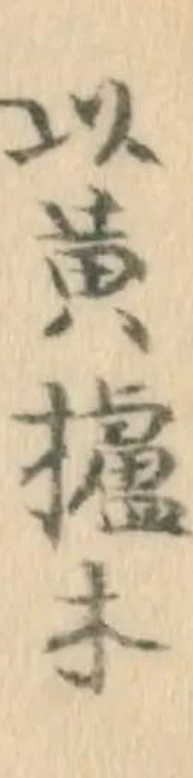以黄櫨木
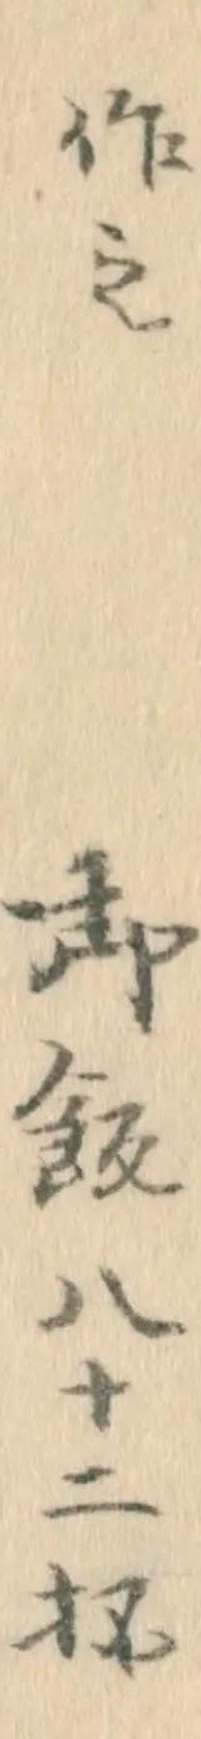作之御飯八十二杯
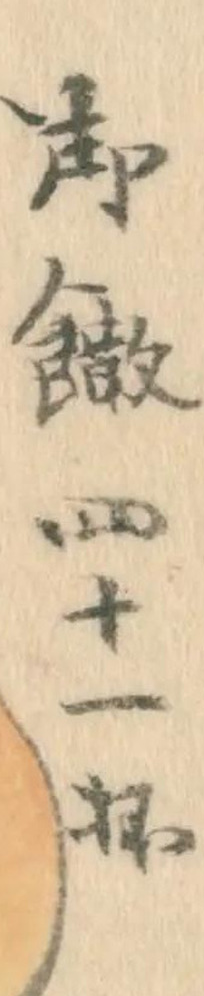御饊四十一杯
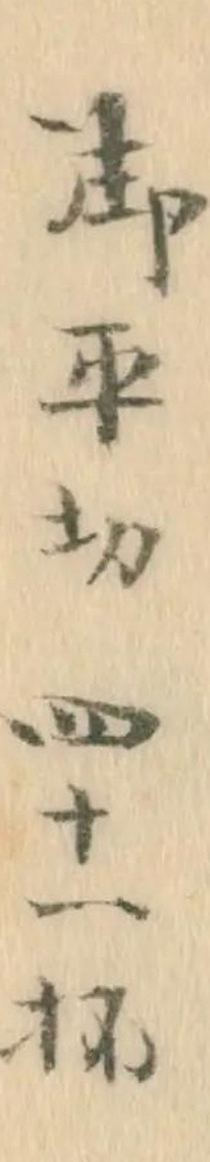御平切四十一杯
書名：葵御祭供進之神饌諸品色目書
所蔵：国立国会図書館 National Diet Library, JAPAN
